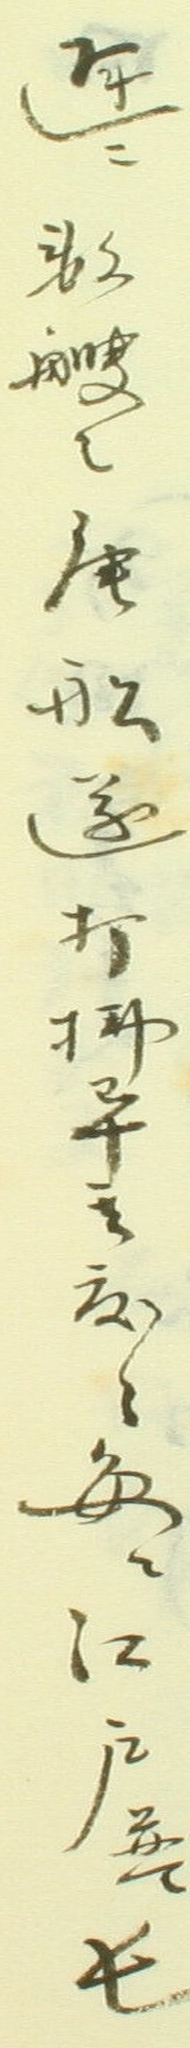逢に数艘之唐船遂打払い其度々毎に江戸？長
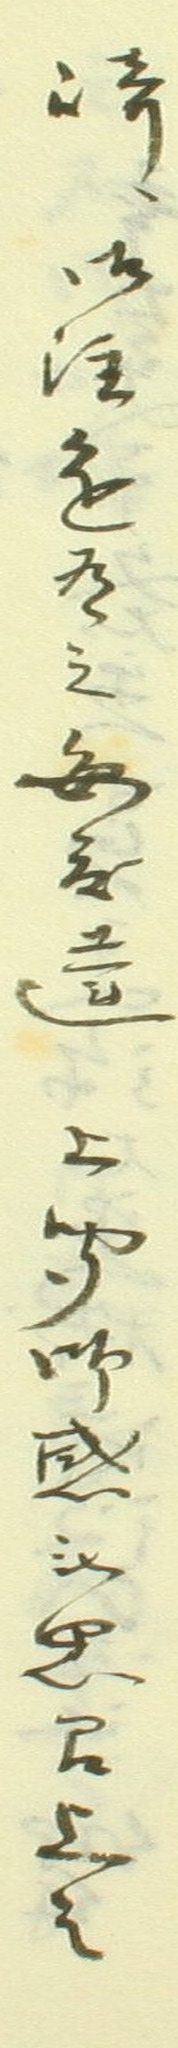崎へ御注進有之毎度？上聞御感被？間上之
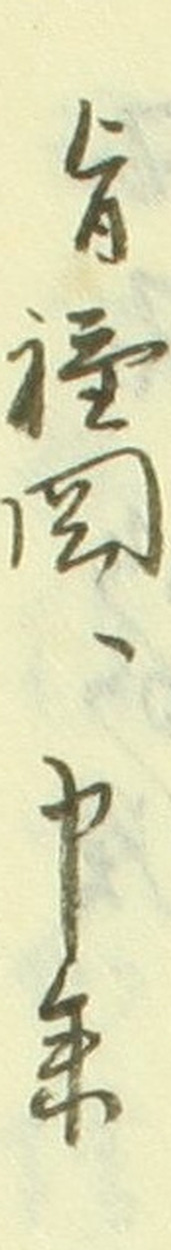旨福岡へ申来
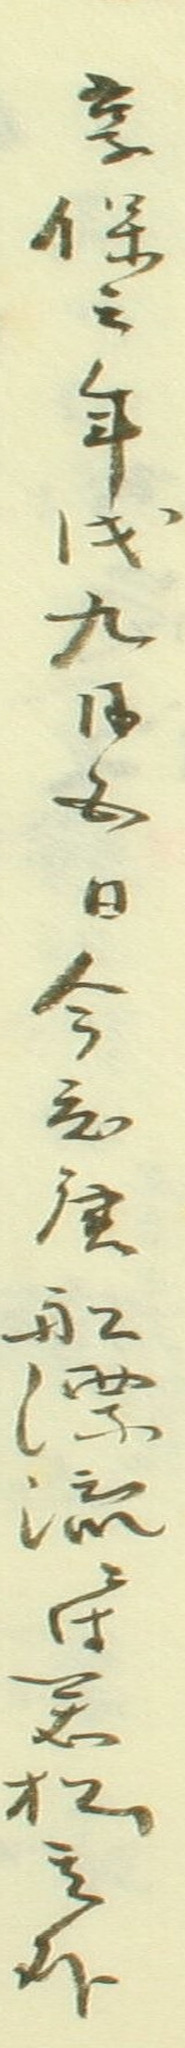一享保三年戌九月五日今度唐船漂流に付若松其外
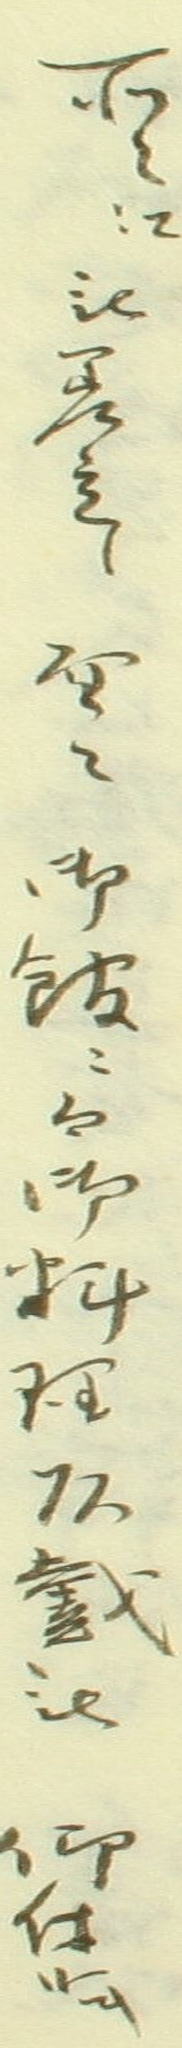所々江被差立て昼の御飯には御料理頂戴被仰付候
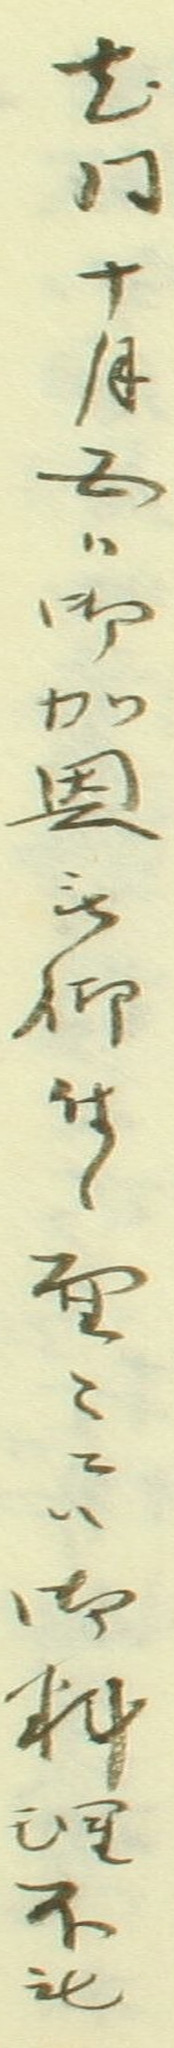尤同十月五日御加恩被仰付候面々には御料理不被
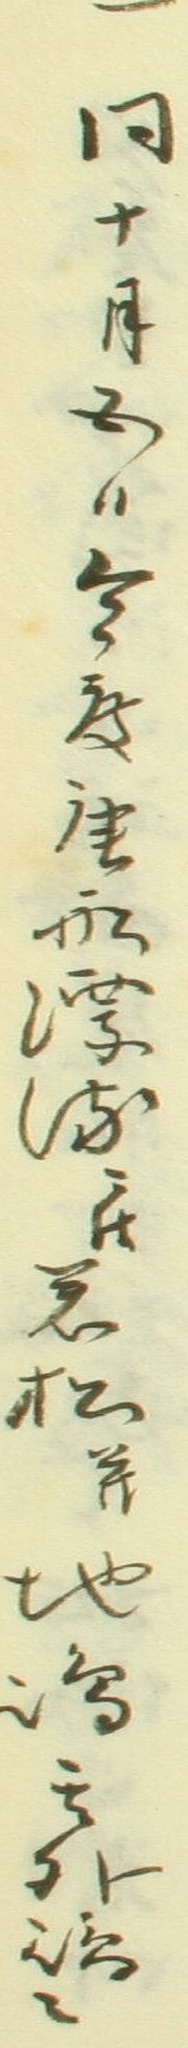一同十月五日今度唐船漂流に付若松並地嶋其外嶋嶋

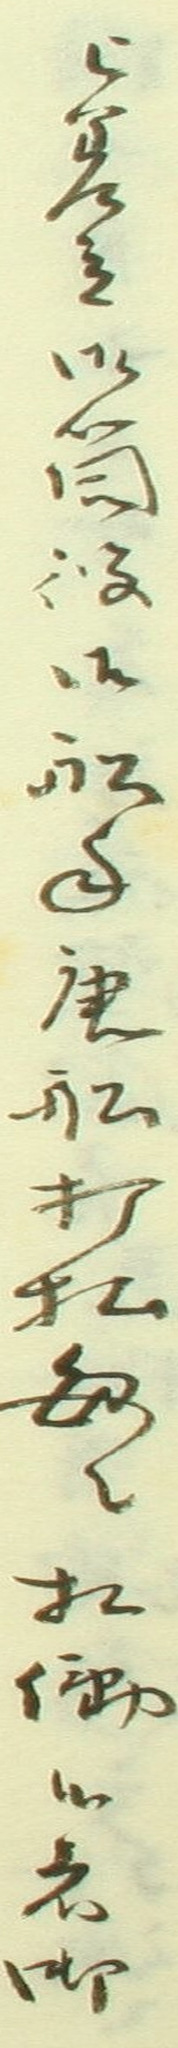被差立御筒役御船手唐船打払毎之相働候者御
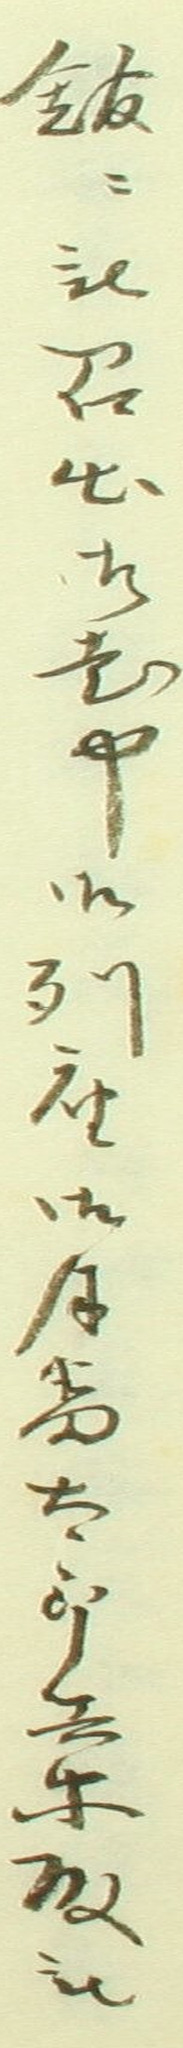飯に被召出御老中御列座御月番太郎兵衛殿被
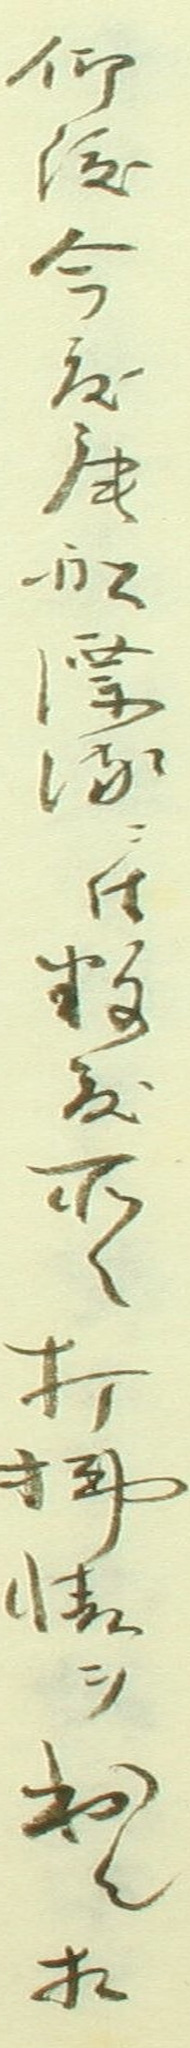仰渡今度船漂流に付数度所々打払情を出し相
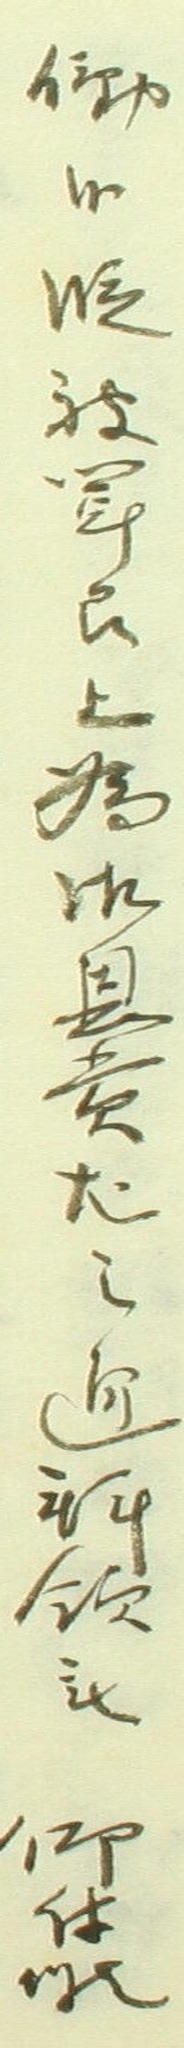働候段被？？上為御具賞左之通拝領被仰付候
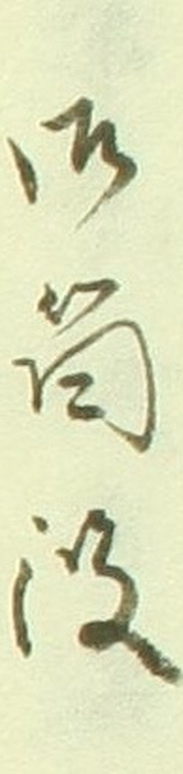御筒役
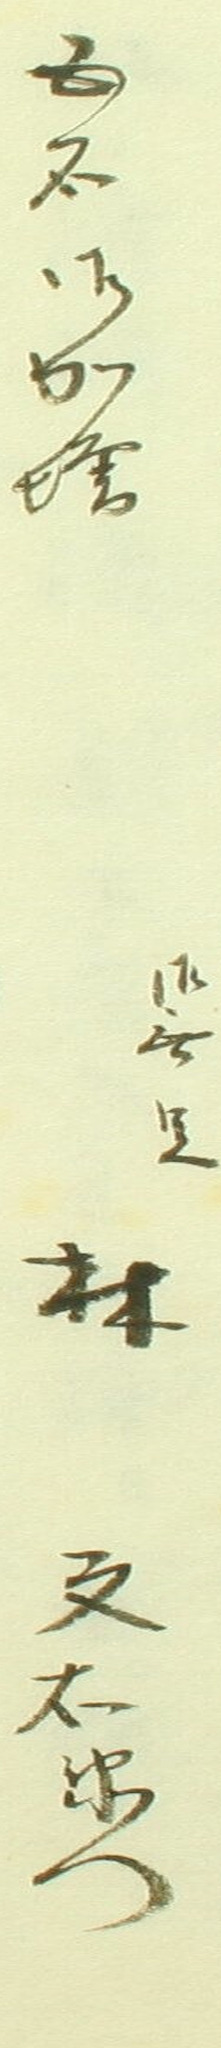五石御加増同臼杵弥右衛門
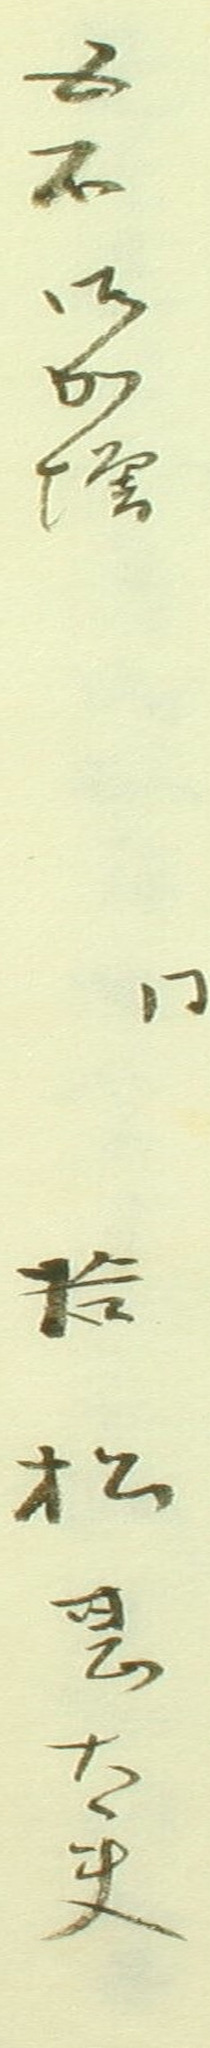五石御加増同若松甚太夫
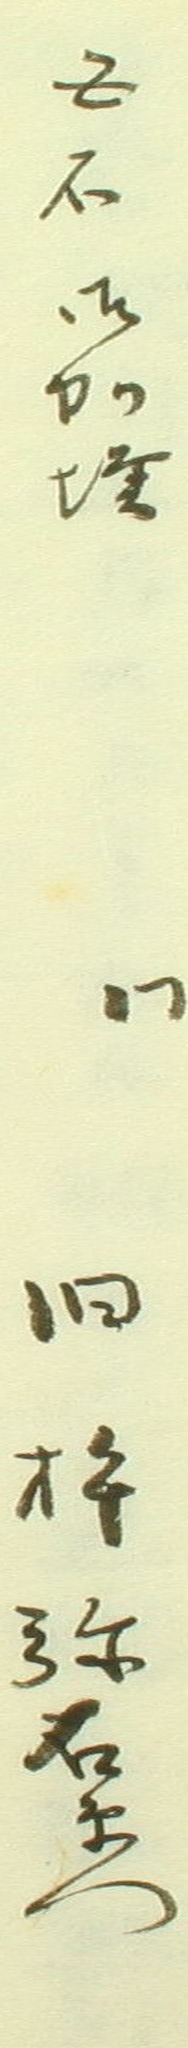五石御加増同臼杵弥右衛門
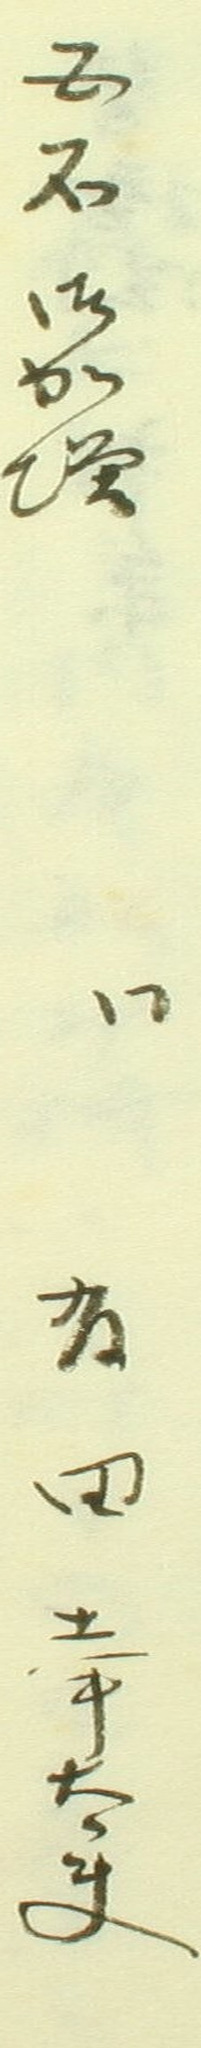五石御加増同有田幸太夫
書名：唐船漂流記 三
